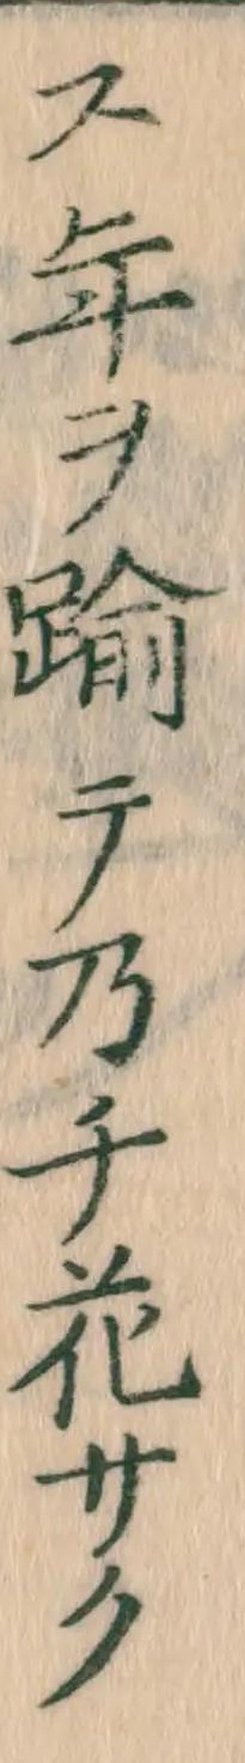ス年ヲ踰テ乃チ花サク
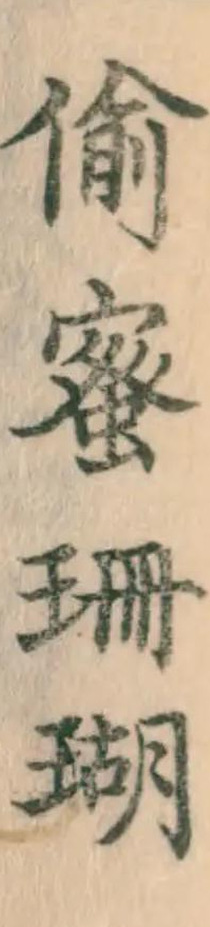偸蜜珊瑚

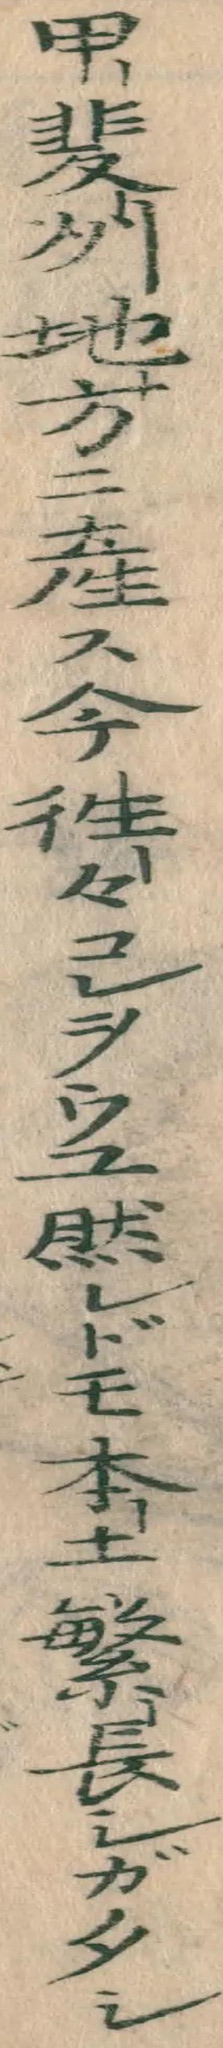甲-斐-州地-方ニ産ス今往-々コレヲウユ然レドモ本-土繁-長シガタシ
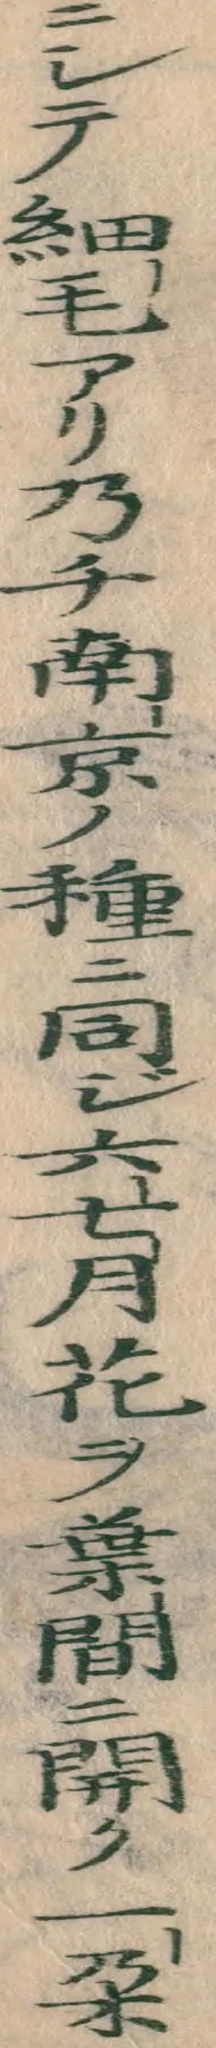ニシテ細-毛アリ乃チ南-京ノ種ニ同ジ六-七-月花ヲ葉-間ニ開ク一-朶
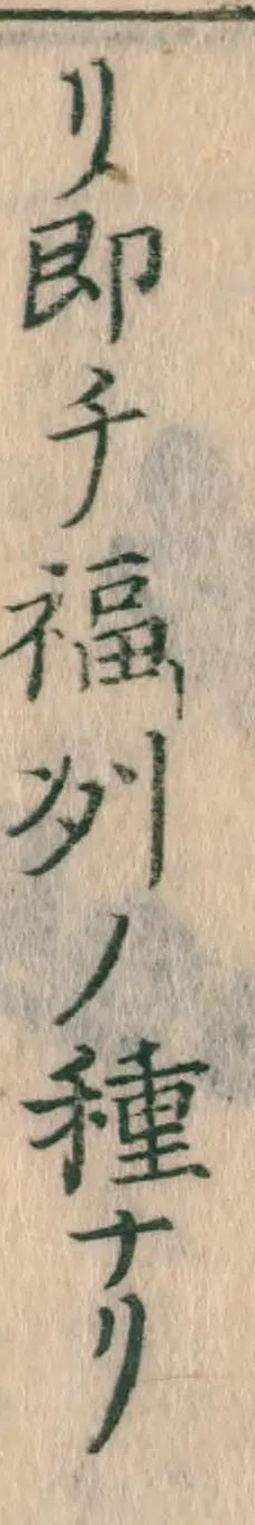リ即チ福-州ノ種ナリ
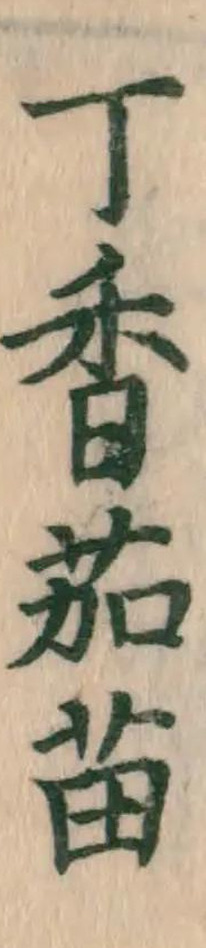丁香茄苗

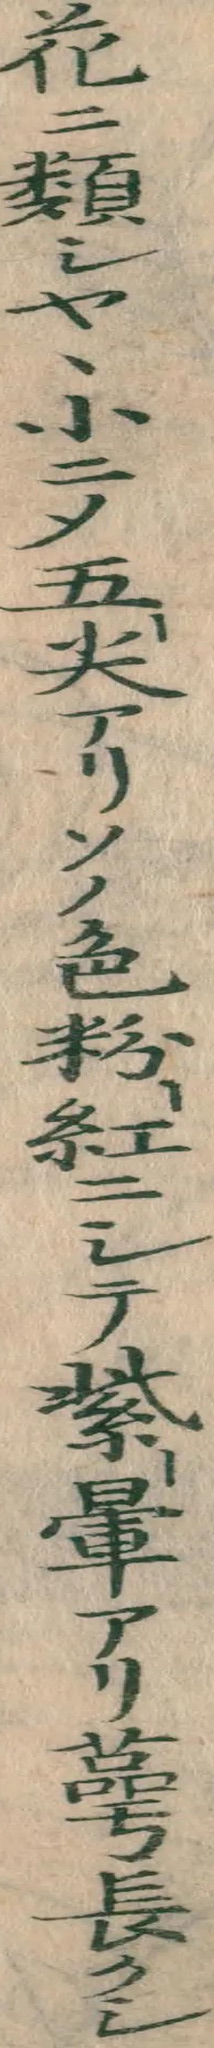花ニ類シヤヽ小ニシテ五-尖アリソノ色粉-紅ニシテ紫-暈アリ萼長クシ
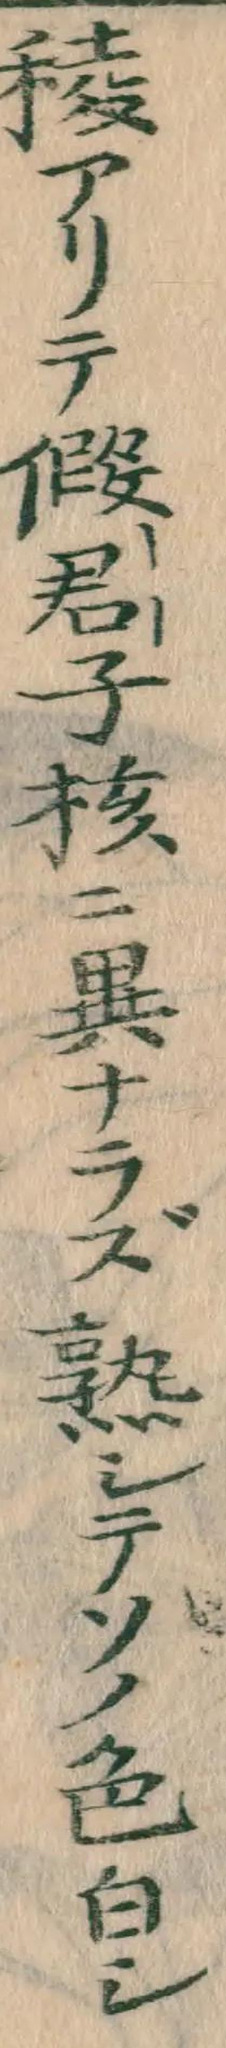稜アリテ仮-君-子核ニ異ナラズ熟シテソノ色白シ
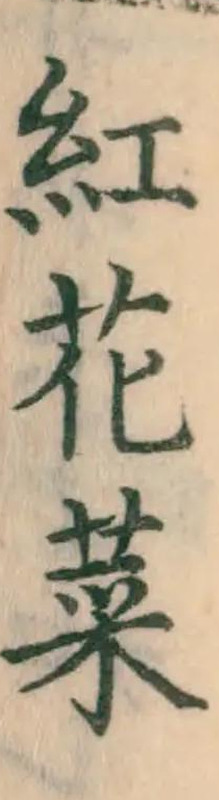紅花菜

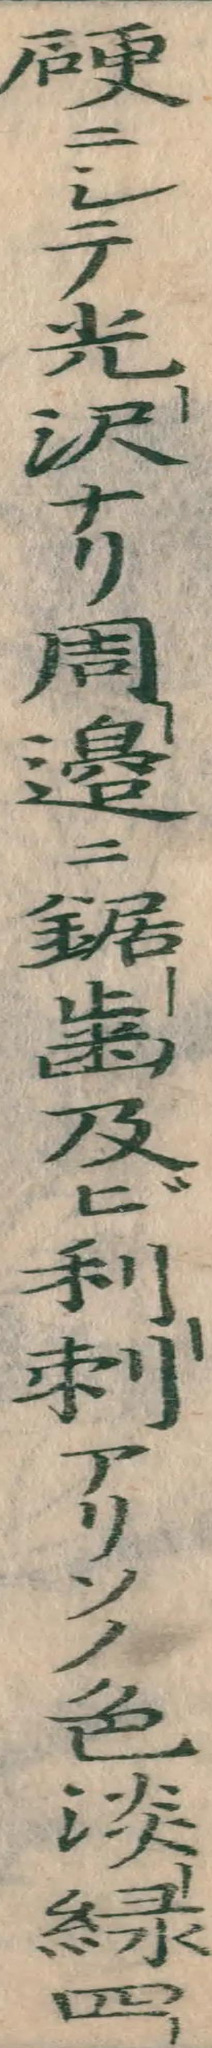硬ニシテ光-沢ナリ周-辺ニ鋸-歯及ビ利-刺アリソノ色淡-緑四-
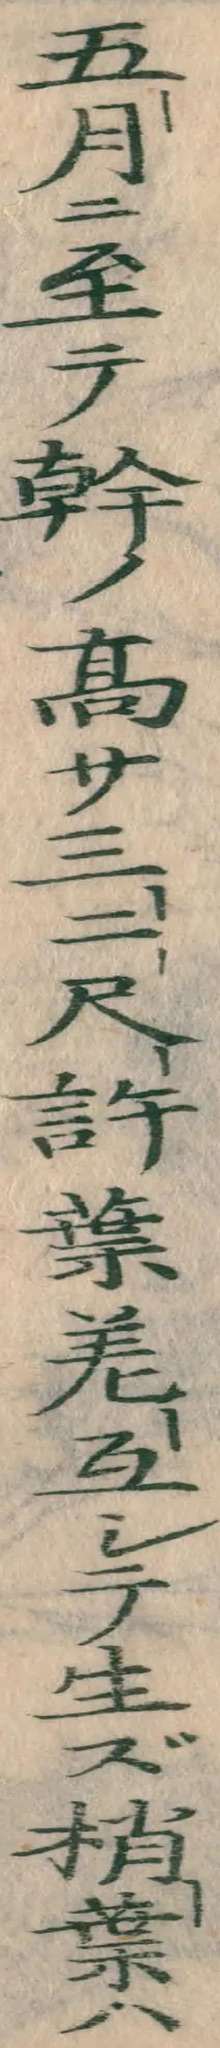五-月ニ至テ幹ノ高サ三-二-尺-許葉差-互シテ生ズ梢-葉ハ
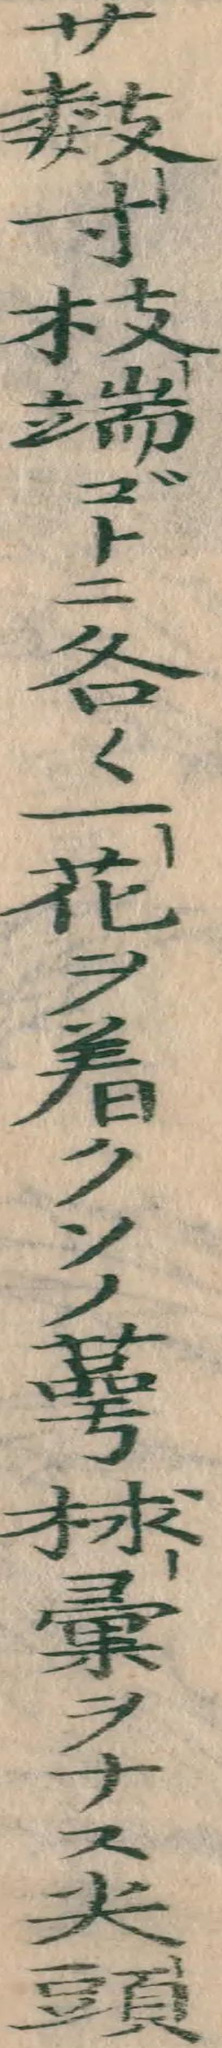サ数-寸枝-端ゴトニ各々一-花ヲ着クソノ萼梂-彙ヲナス尖-頭
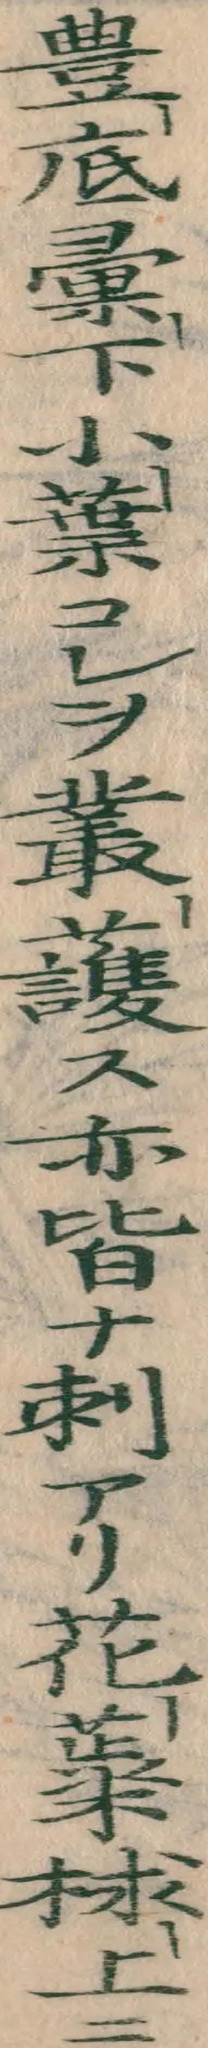豊-底彙-下小-葉コレヲ叢-護ス亦皆ナ刺アリ花-蕊梂-上ニ
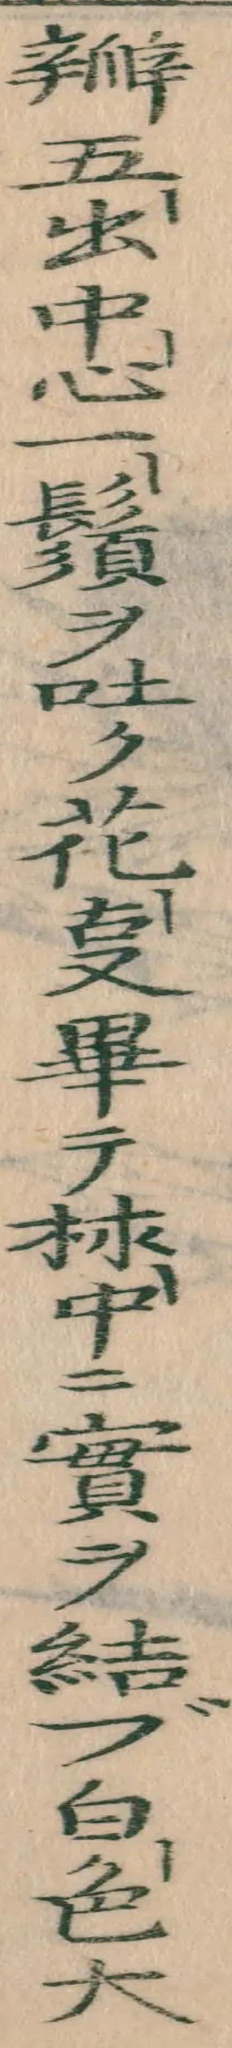弁五-出中-心一-鬚ヲ吐ク花-事畢テ梂-中ニ実ヲ結ブ白-色大
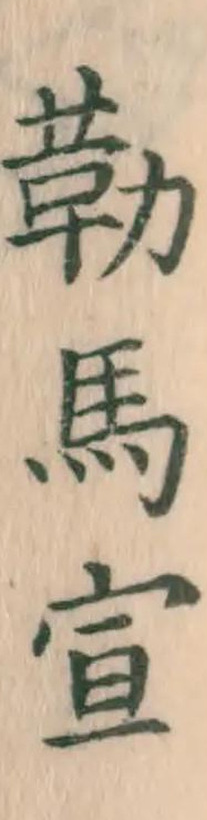勒馬宣

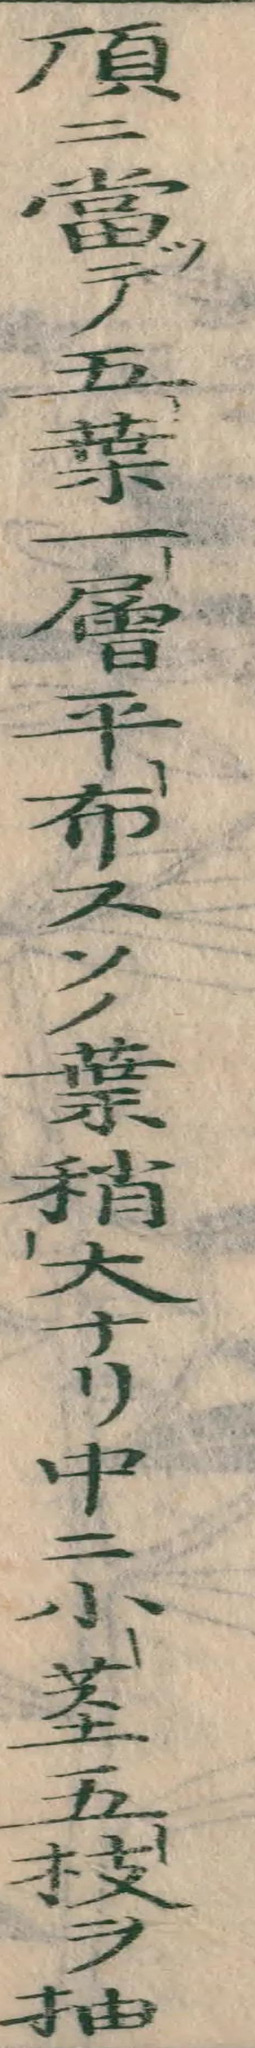頂ニ当テ五-葉一-層平-布スソノ葉稍-大ナリ中ニ小-茎五-枝ヲ抽
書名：花彙 草部4巻木部4巻. [1]
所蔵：国立国会図書館 National Diet Library, JAPAN
